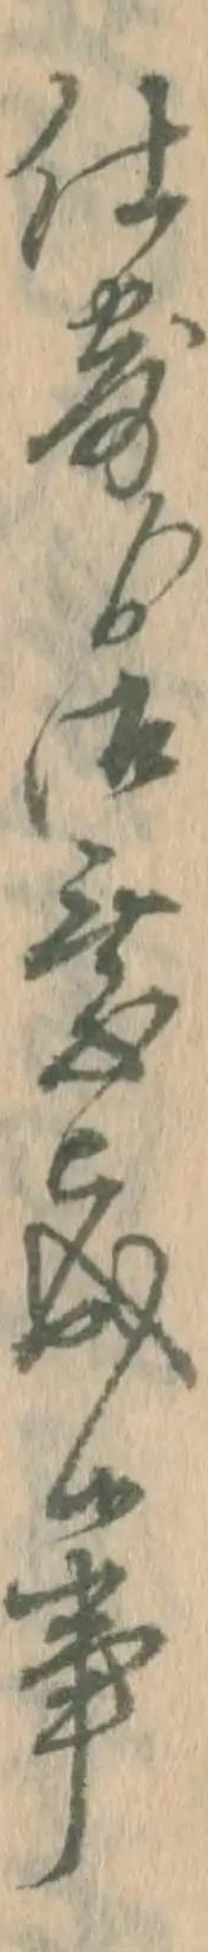仕寄ゟ御乗被成候事

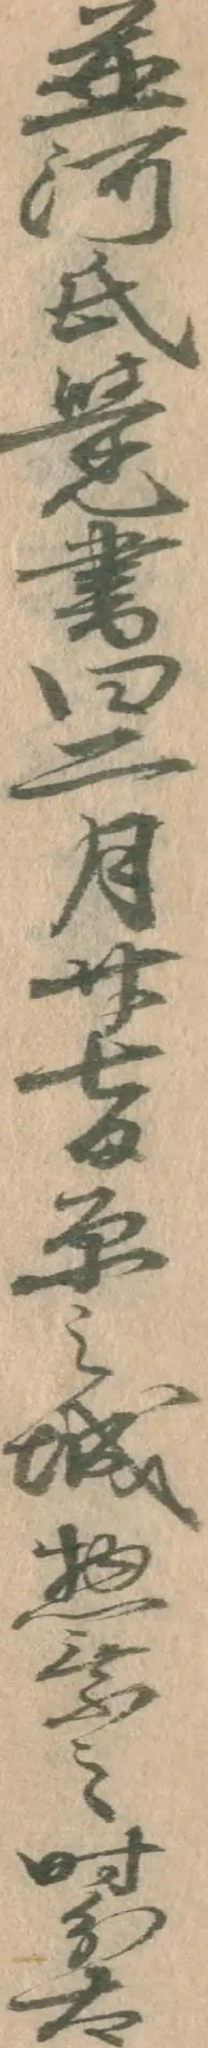並河氏覚書曰二月廿七日原之城惣乗之時分太
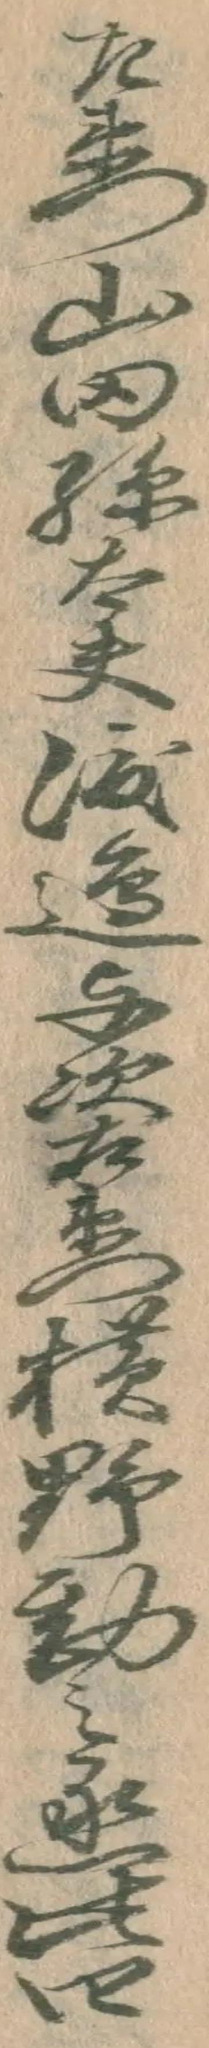左衛門山田孫太夫渡辺与次右衛門横野勘之丞此四
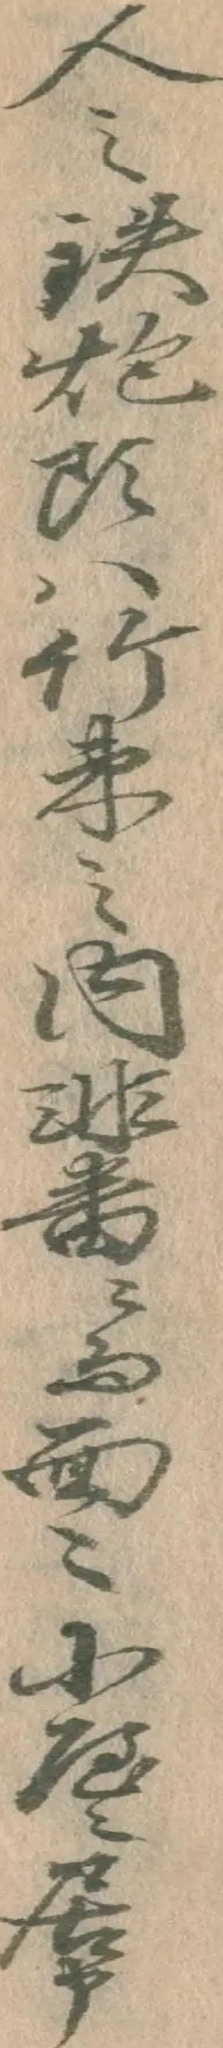人之鉄砲頭は竹束之内非番に而面々小屋に居申
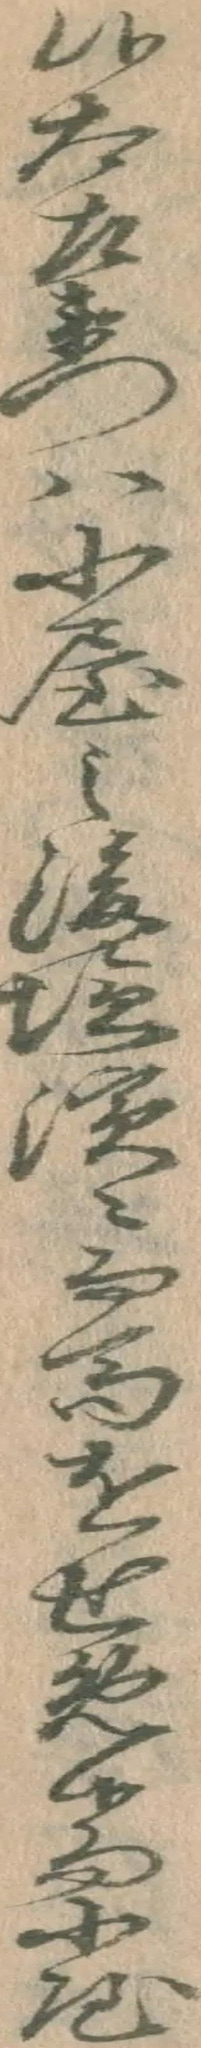候太左衛門は小屋之後塩浜に而馬をせ免候而小屋
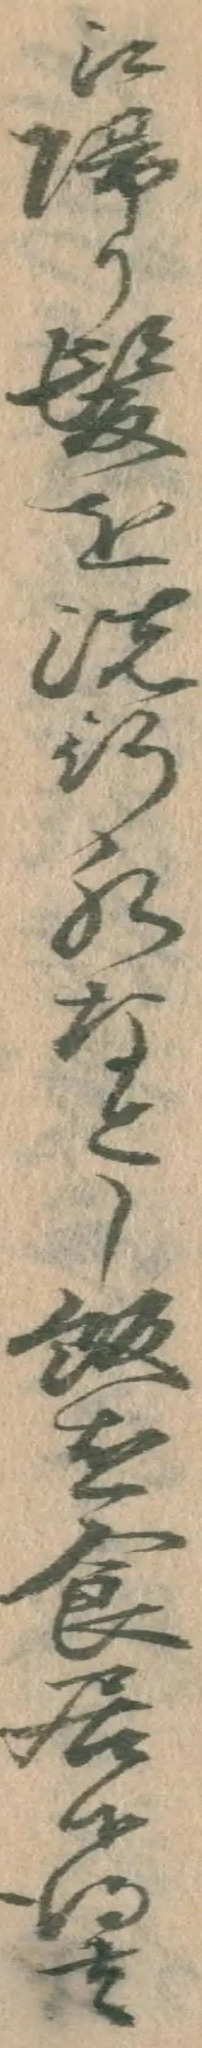江帰り髪を洗行水なとし飯を食居候得者
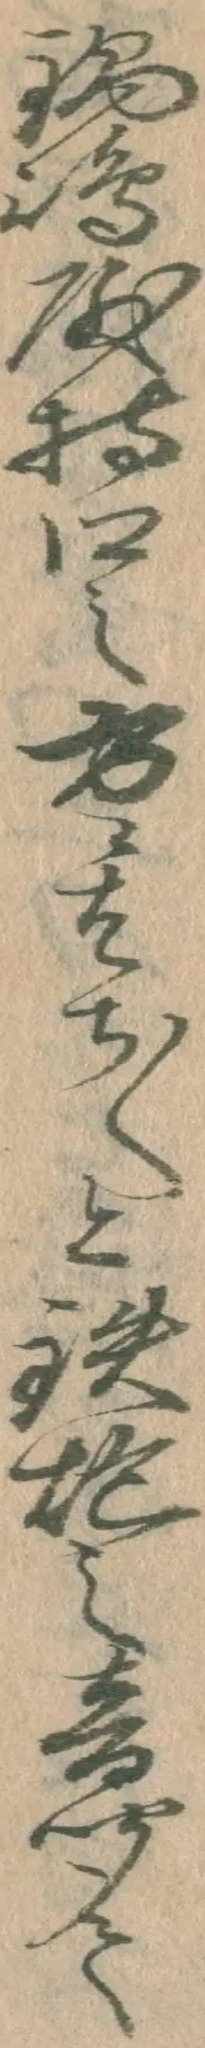鍋島殿持口之方に者ちゝと鉄砲之音聞て
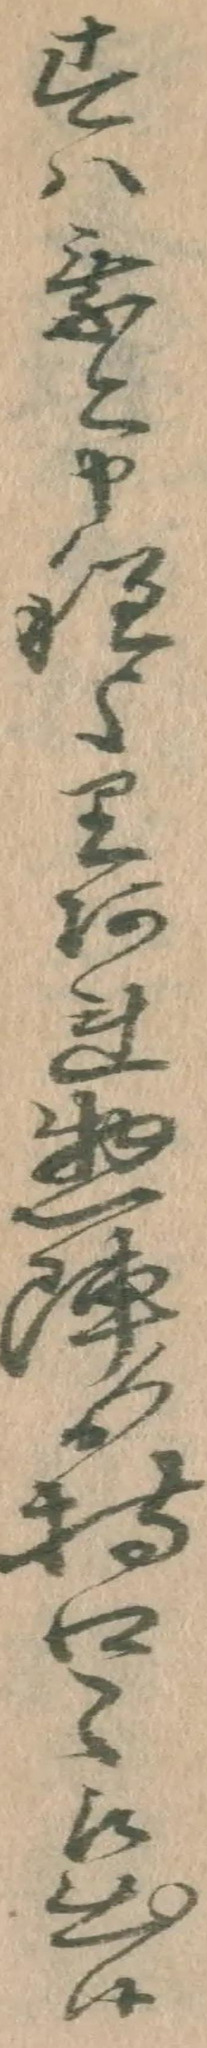春は乗と申程よ里阿連惣陣ゟ持口々江出候
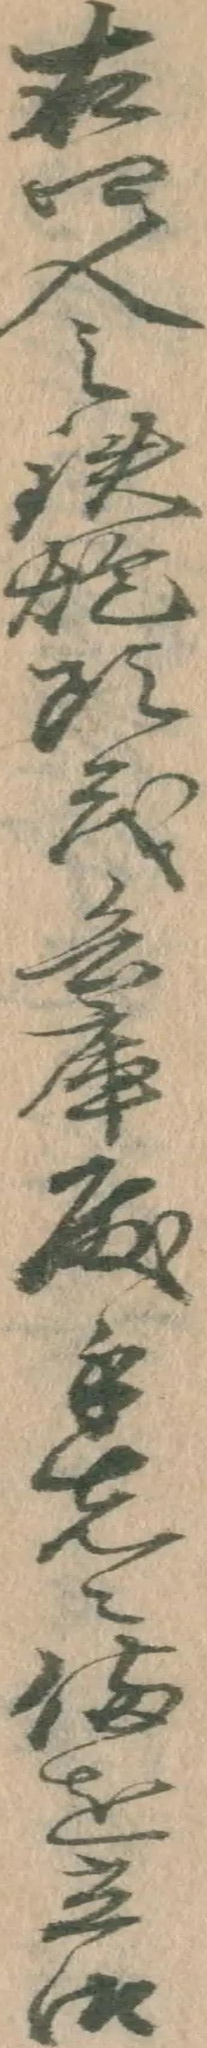右四人之鉄砲頭茂兵庫殿手先に備を立御
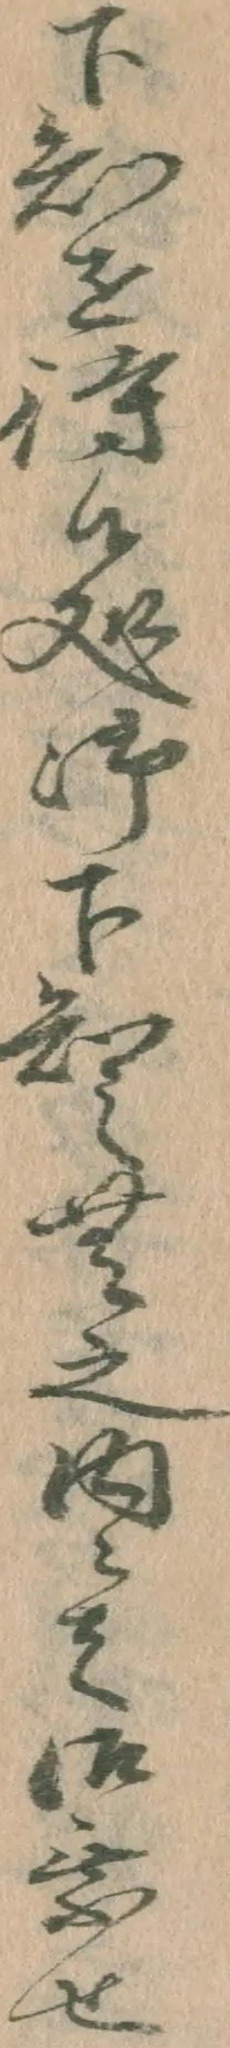下知を待候処御下知之無之内に者御乗せ
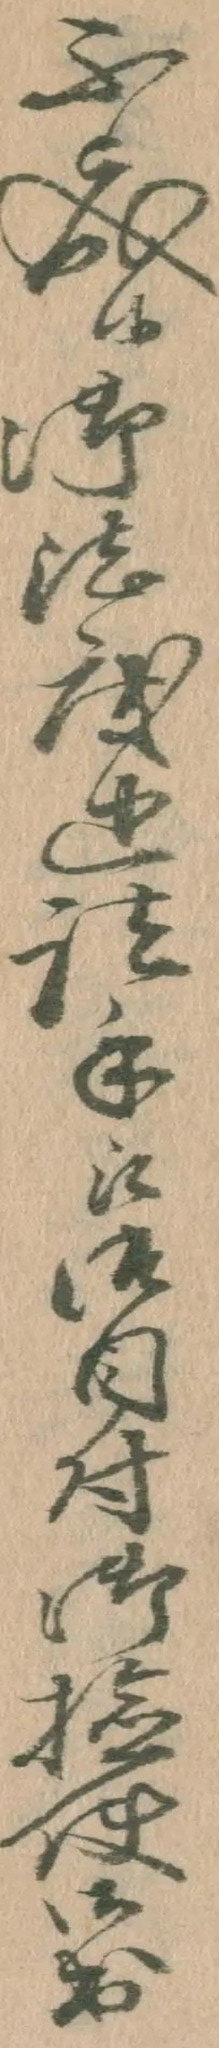ふ被成候御法度迚諸手江御目付御権使御出
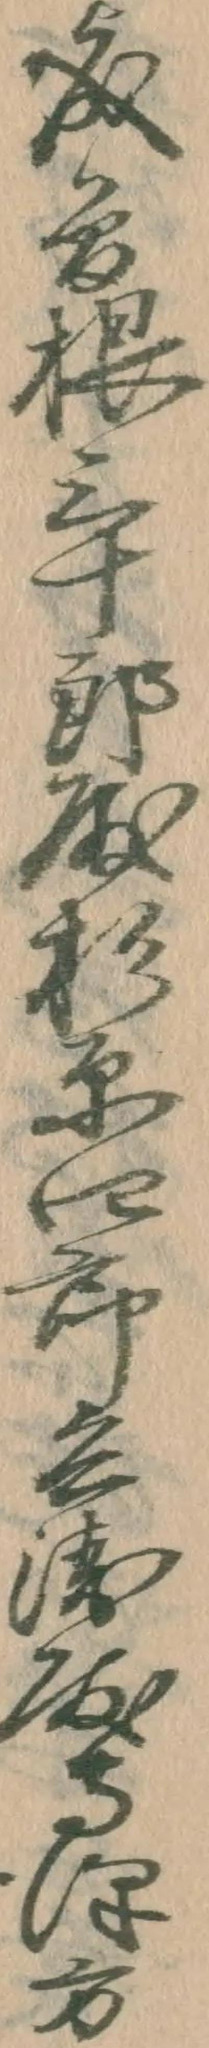被成曽根三十郎殿杉原四郎兵衛殿寺沢方
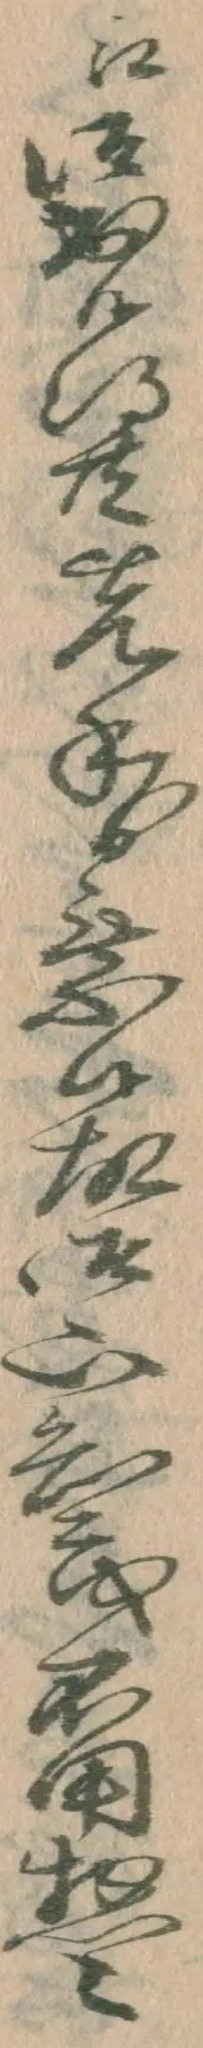江御出候得共先手ゟ乗候故御下知茂不用惣々
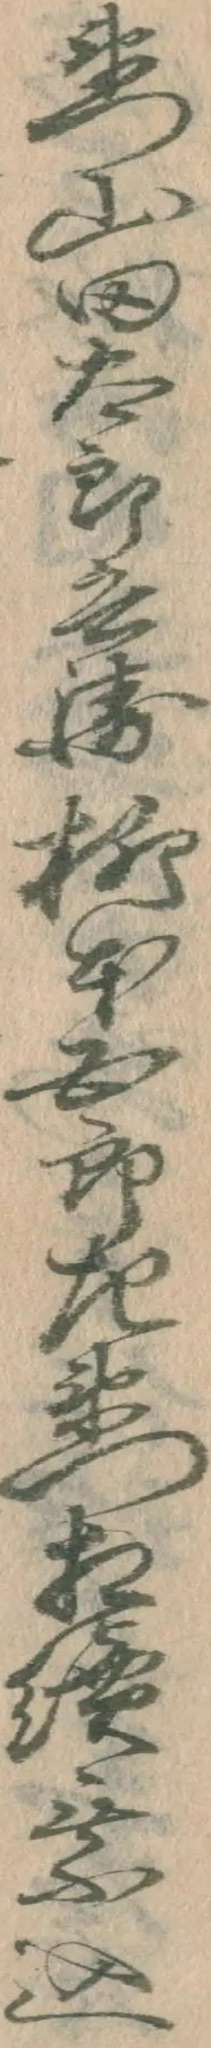衛門山田太郎兵衛柳本五郎左衛門相続乗込
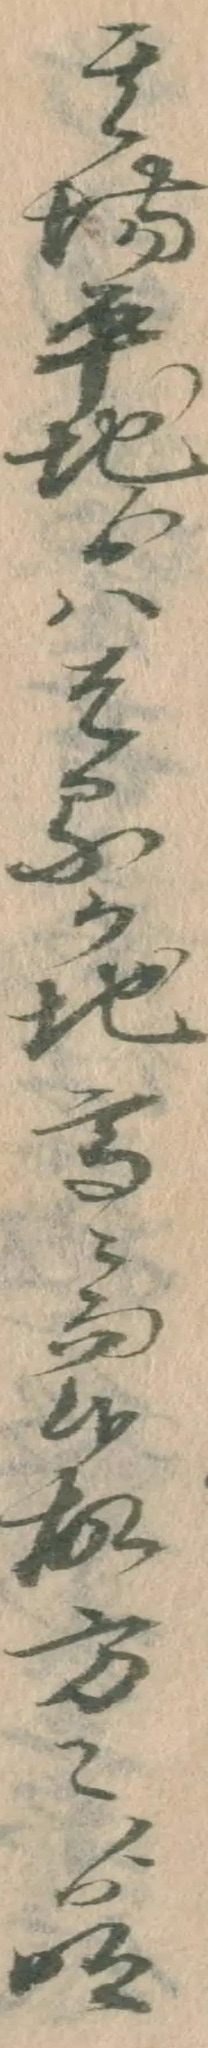其場平地ゟは者累か地高に而候故方々ゟ明
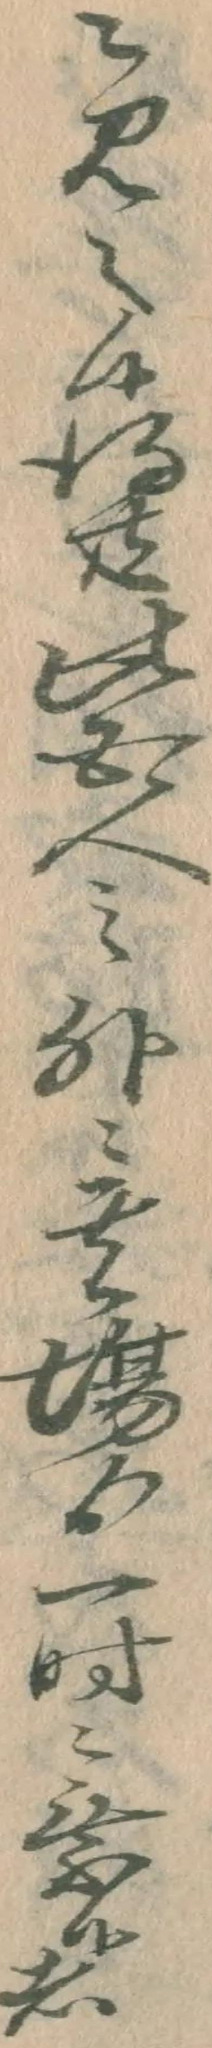に見へ候得共此五人之外に其場ゟ一時に乗候者
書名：切支丹御退治記 49巻. [8]
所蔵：国立国会図書館 National Diet Library, JAPAN
